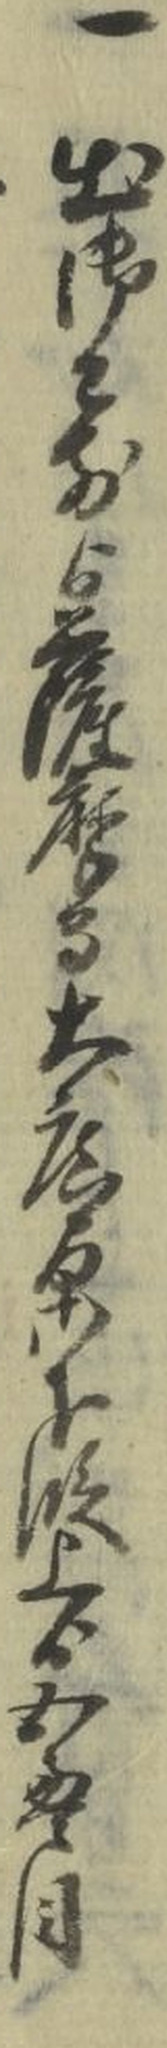一出御已然ゟ薩摩守大広間御下段上ゟ五畳目
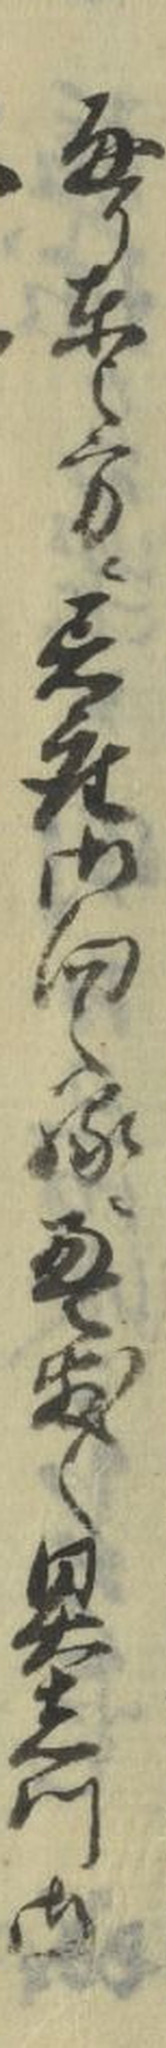通り東之方に着座御向之縁に畳敷之具志川御
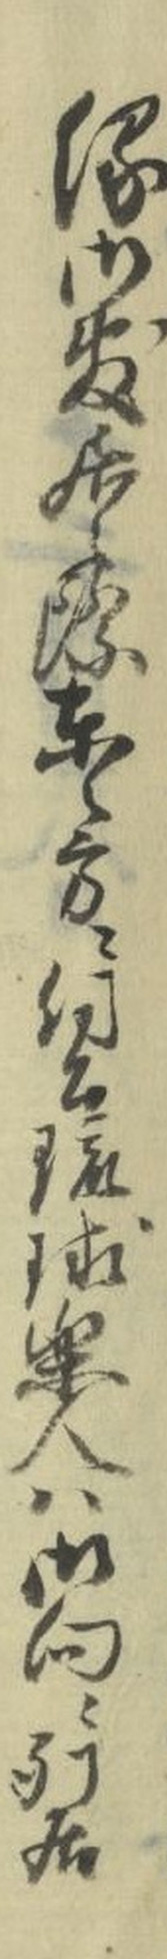縁御敷居之際東之方に伺公琉球楽人は御向に列居
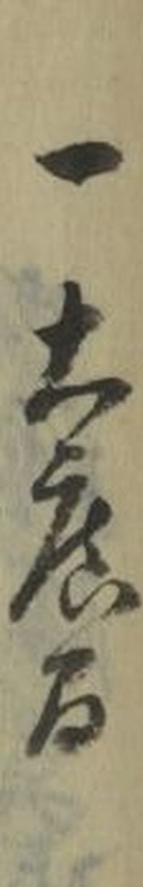一大広間
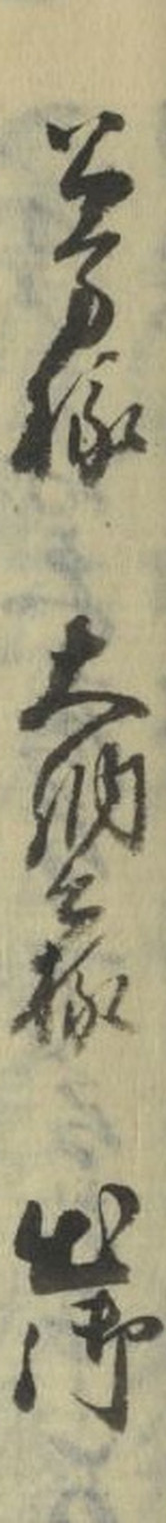公方様大納言様出御
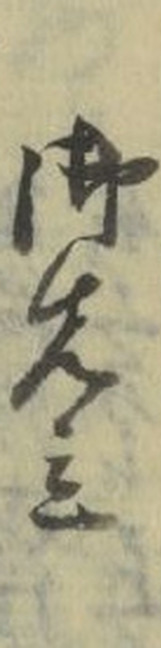御先立
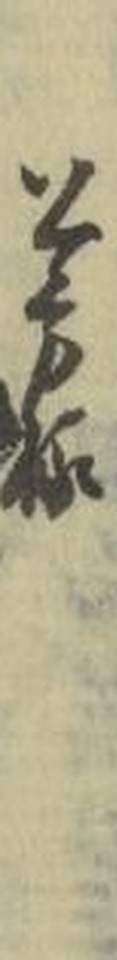公方様
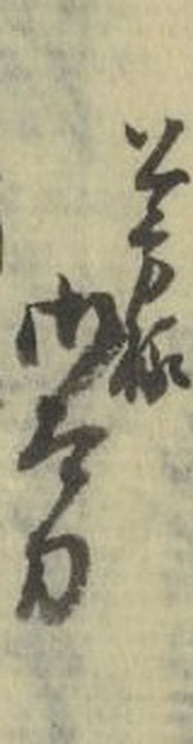御太刀
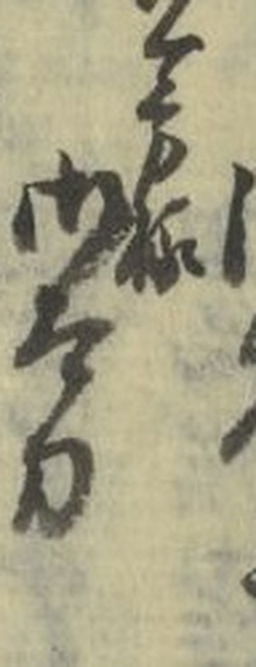御太刀
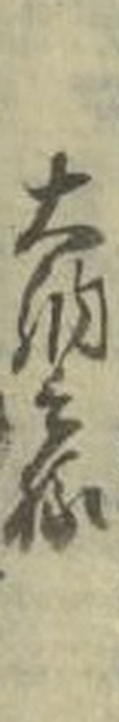大納言様
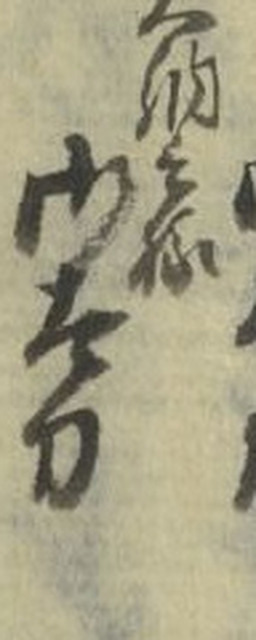御太刀
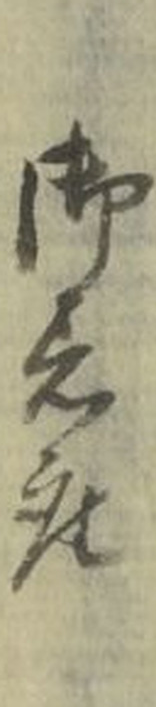御着座
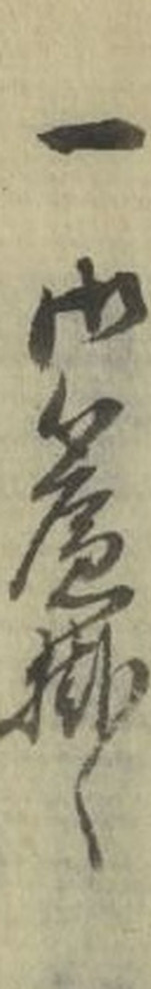一御簾掛之
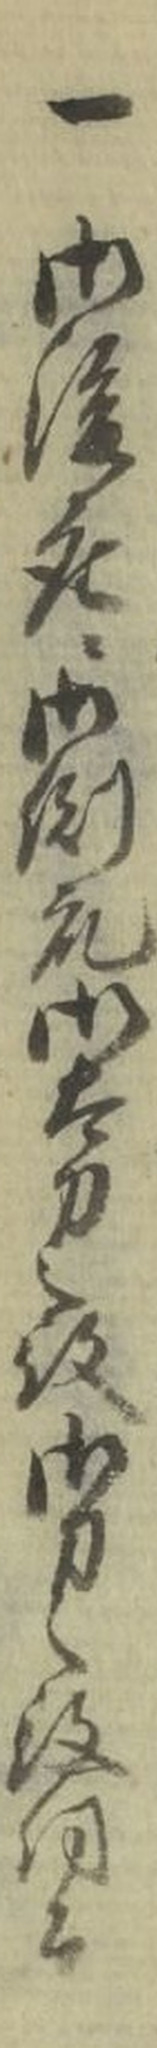一御後座に御側衆御太刀之役御刀之役伺公
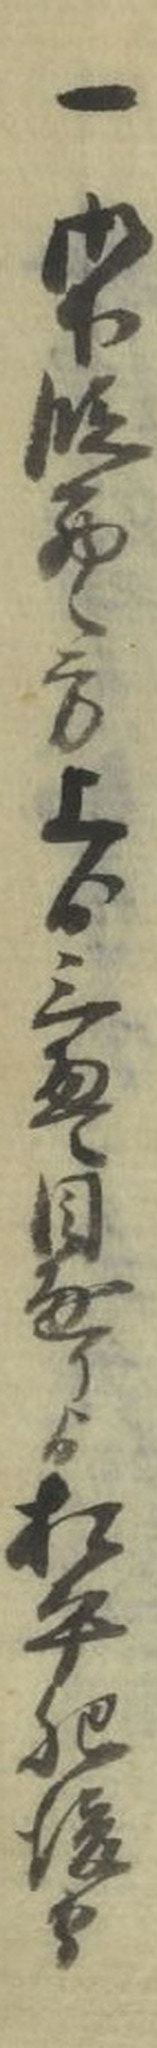一御下段西之方上ゟ三畳目通りゟ肥後守

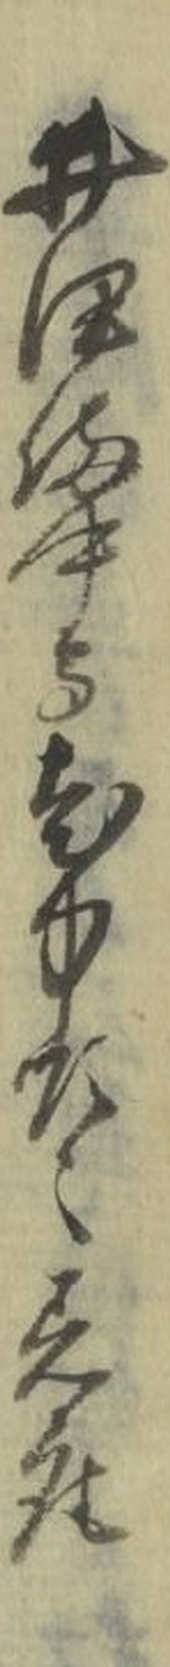井伊備中守老中順々着座
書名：戊辰琉球人来朝之式 全
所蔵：University of the Ryukyus Library
